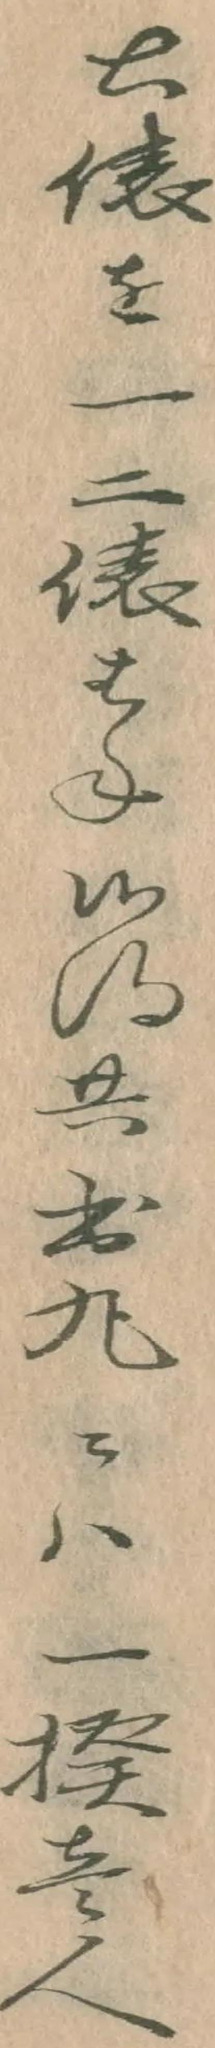土俵を一二俵者年候得共出丸には一揆壱人
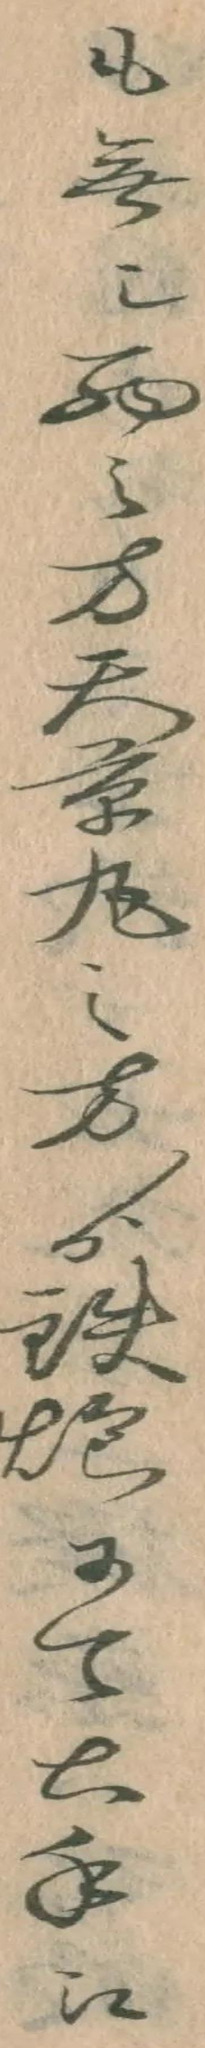も無し西之方天草丸之方ゟ鉄砲尓て土手江
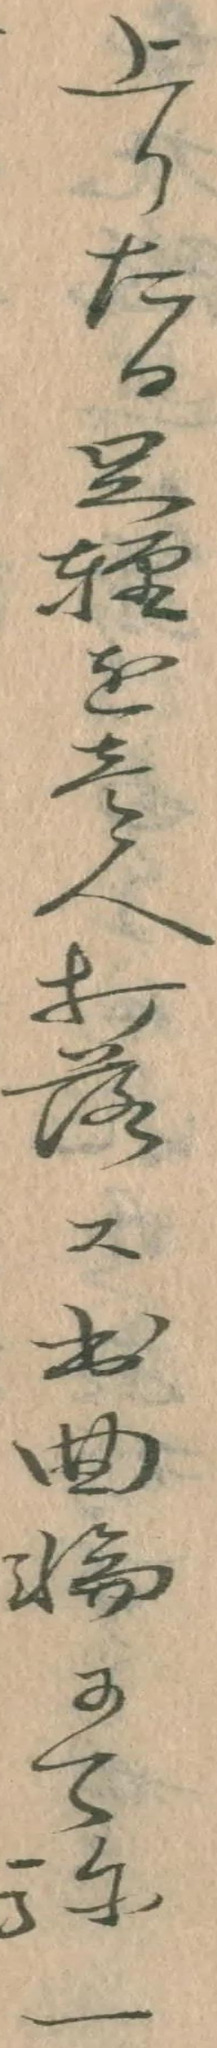上りたる足軽を壱人打落す出曲輪尓て弥一
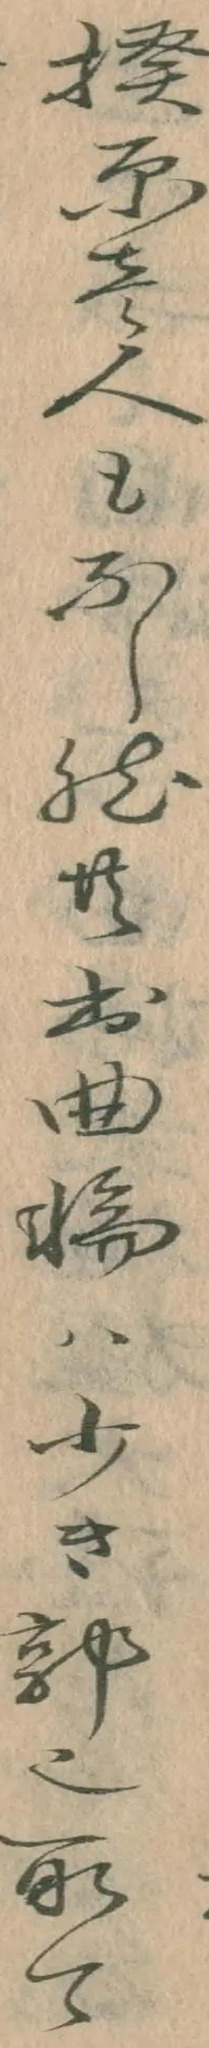揆原壱人もなし然共出曲輪は少き郭也取て
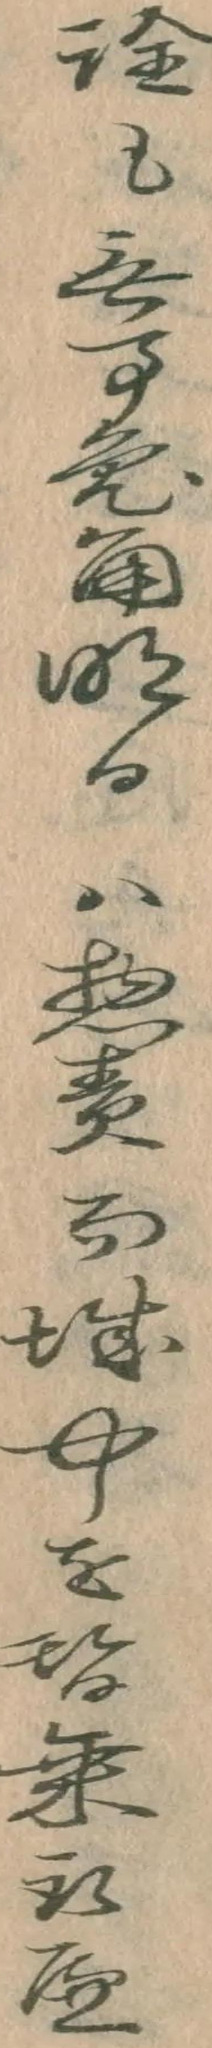詮も無事兎角明日は惣責而城中を替乗取扁
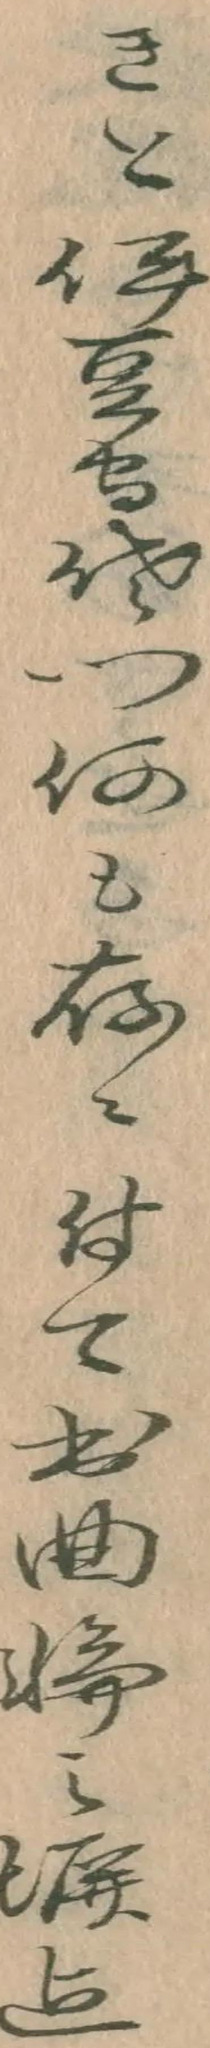きと伊豆守佐門何も存に付て出曲輪之塀迄
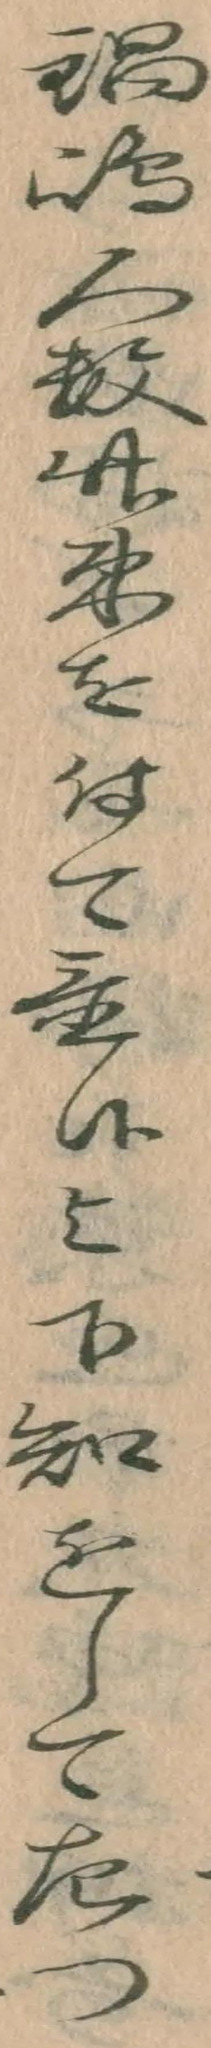鍋島人数竹束を付て置候与下知をして左門
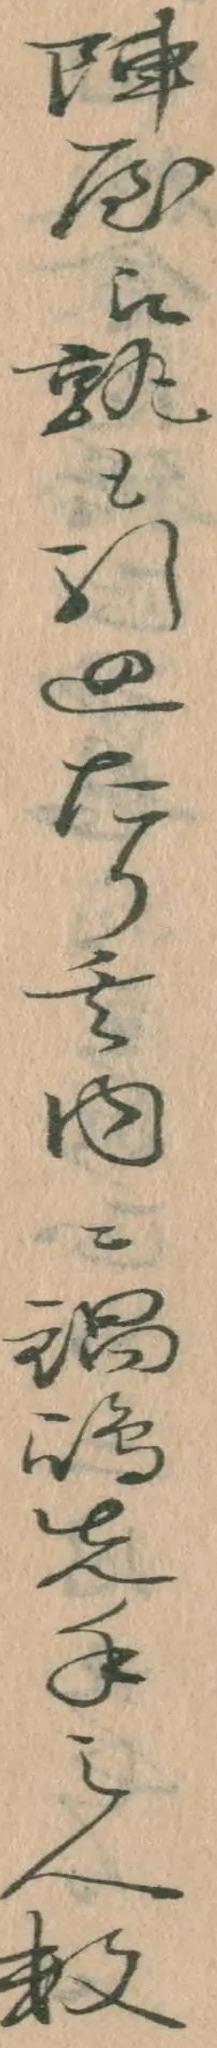陣屋江孰も引込たり其内に鍋島先手之人数
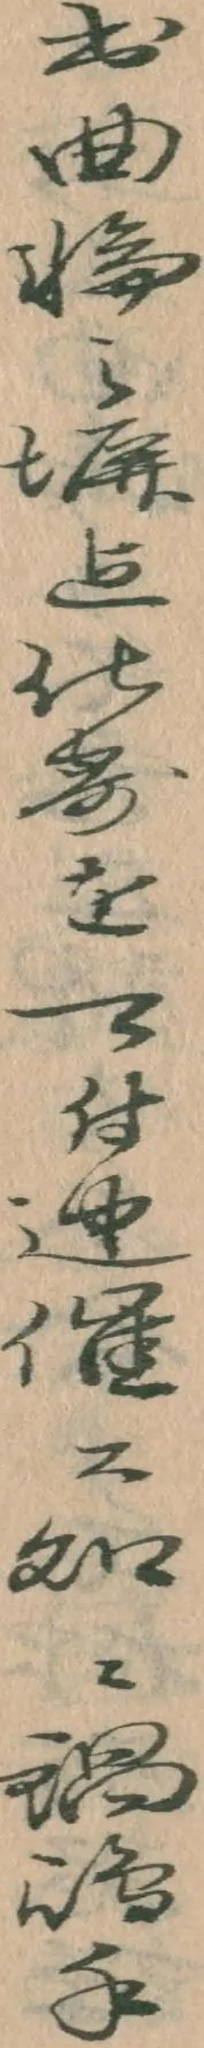出曲輪之塀迄仕寄を可付迚催す処に鍋島手
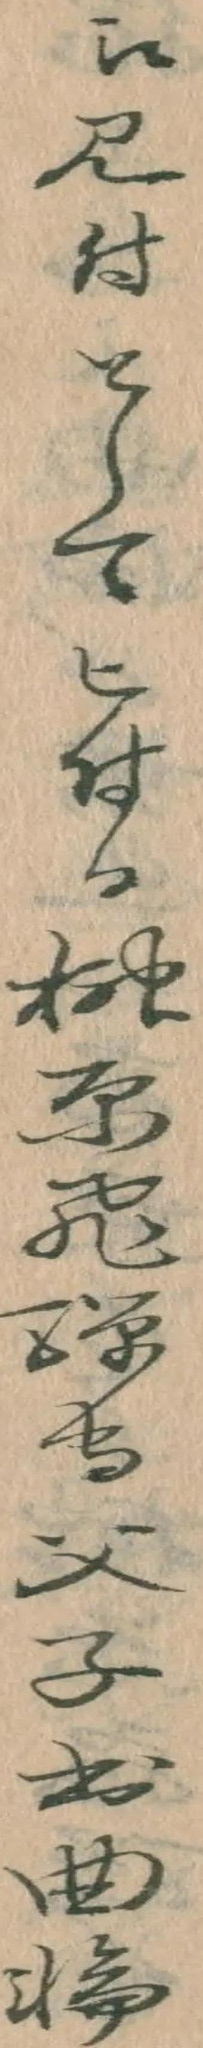江見付として被付る榊原飛騨守父子出曲輪
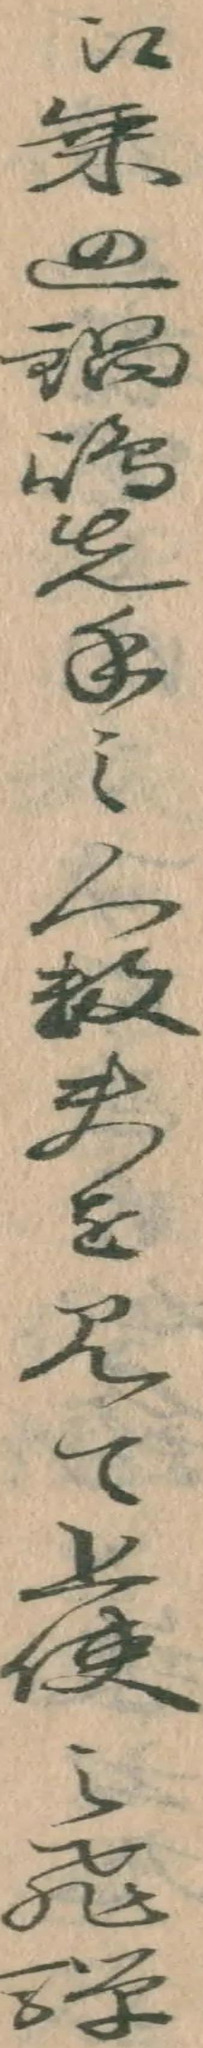江乗込鍋島先手之人数夫を見て上使之飛騨
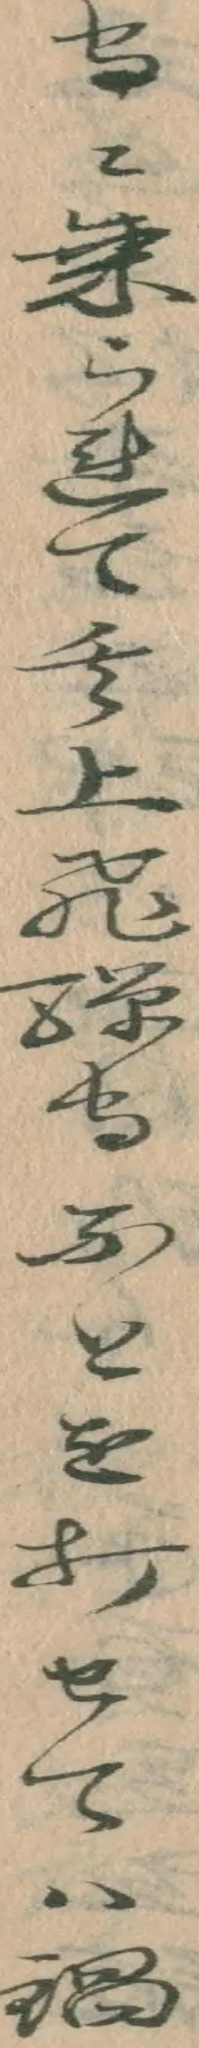守に乗ら連て其上飛騨守なとを打せては鍋
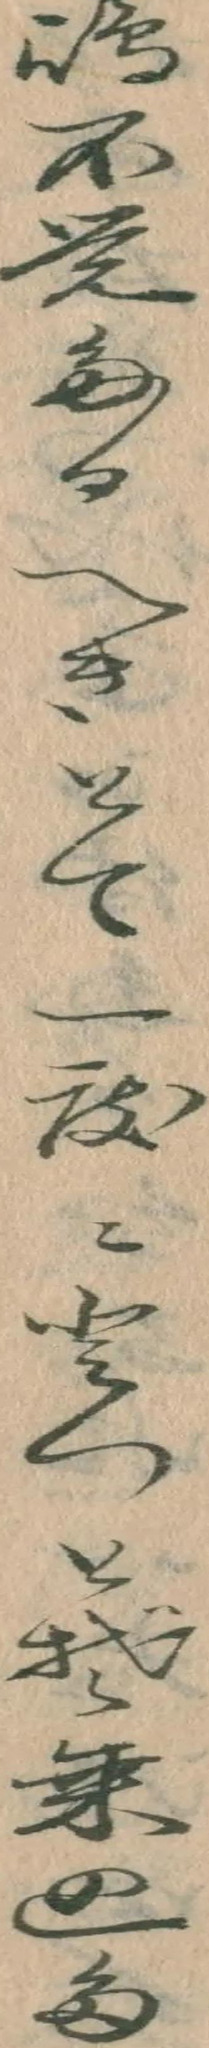島不覚多るへきとて一度に登つと楚乗込多
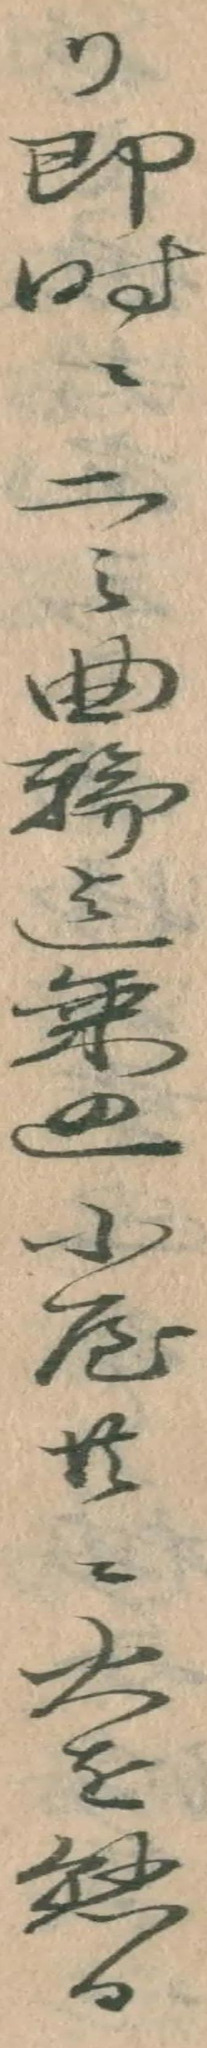り即時に二之曲輪迄乗込小屋共に火を懸る
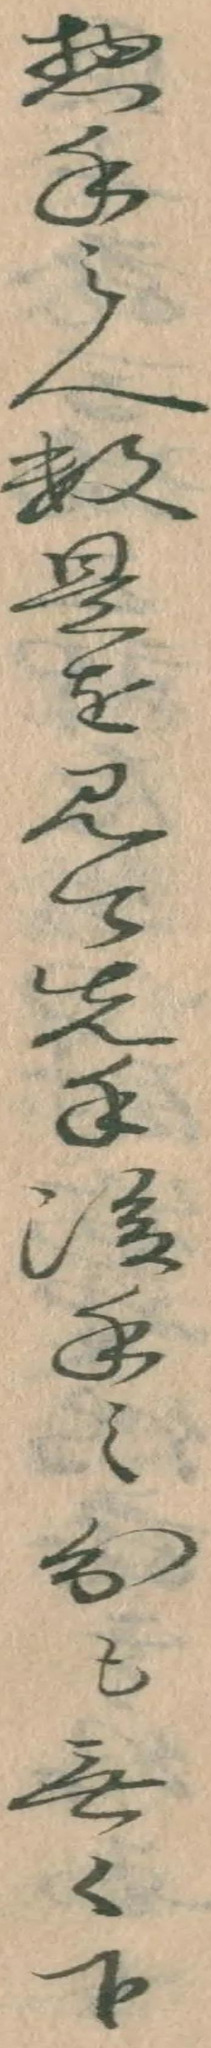惣手之人数是を見て先手後手之分も無く下
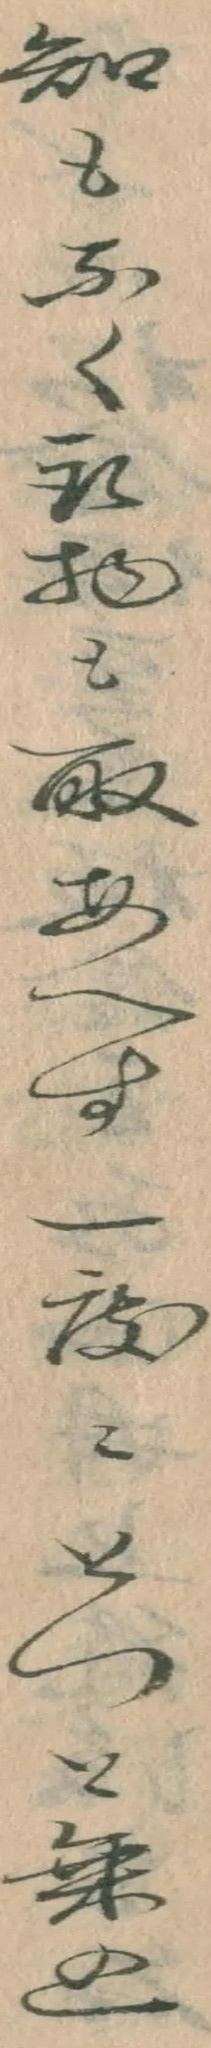知もなく取物も取あへす一度にとつと乗込
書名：切支丹御退治記 49巻. [8]
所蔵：国立国会図書館 National Diet Library, JAPAN
